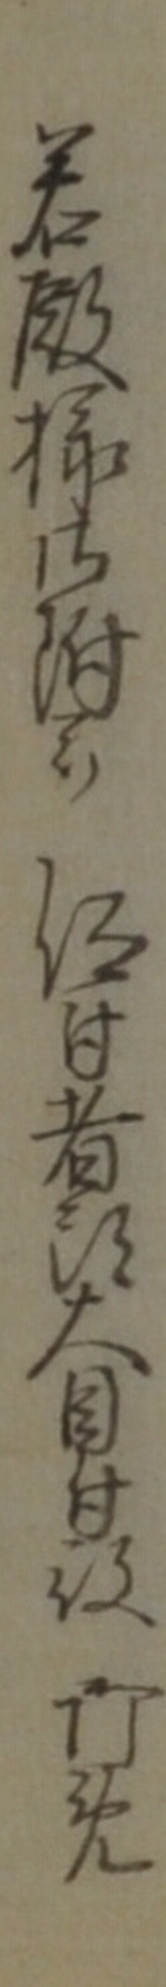若殿様御附被仰付者頭大目付役御免
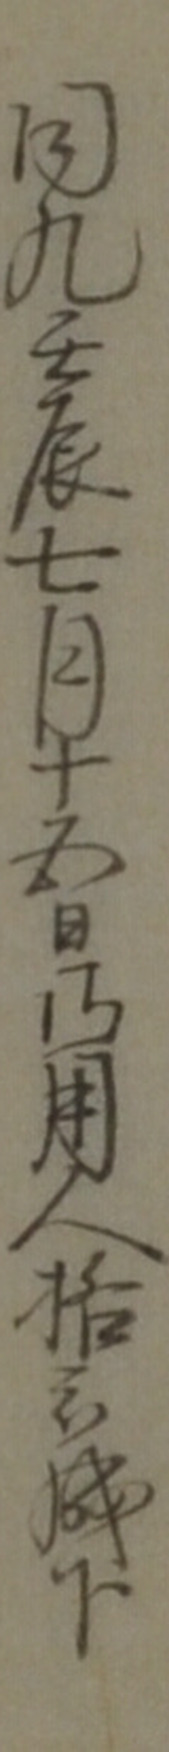一同九壬辰七月十五日御用人格被成下
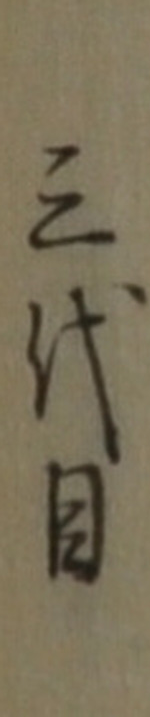三代目
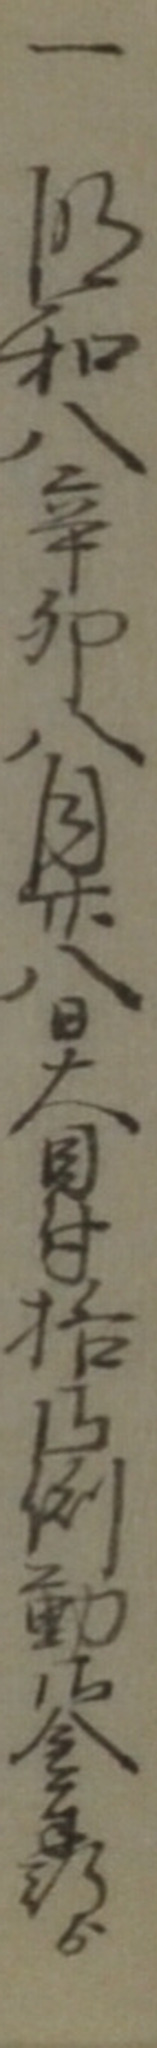一明和八辛卯八月廿八日大目付格御側勤御金奉行ゟ
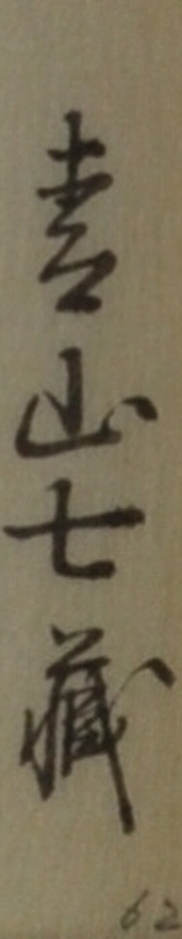青山七蔵
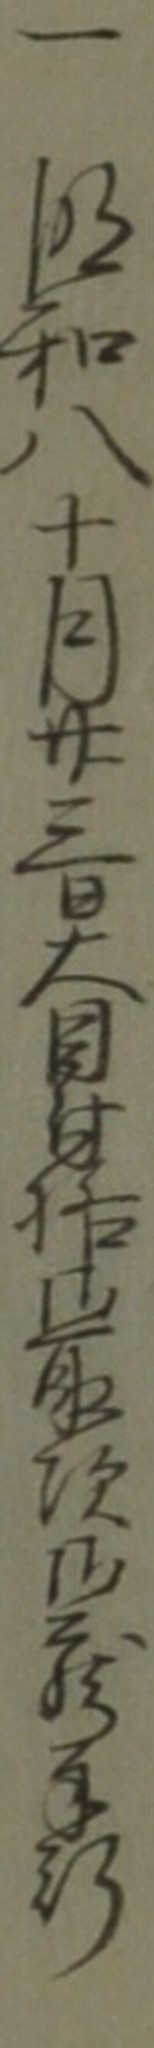一明和八十月廿三日大目付格御取次御蔵奉行
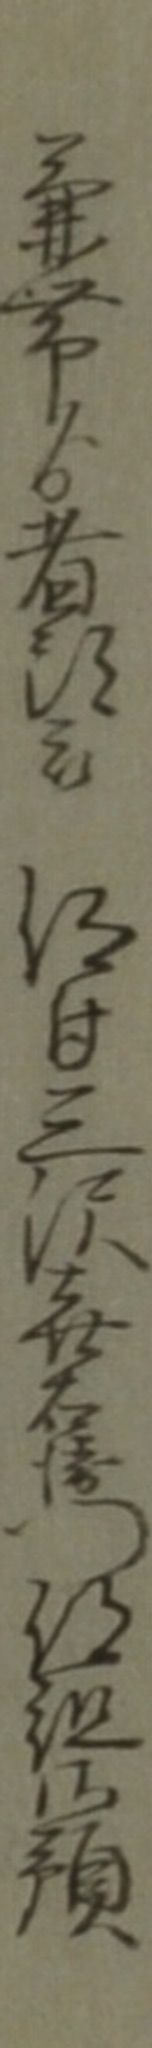兼帯ゟ者頭被仰付三沢喜右衛門跡組御預
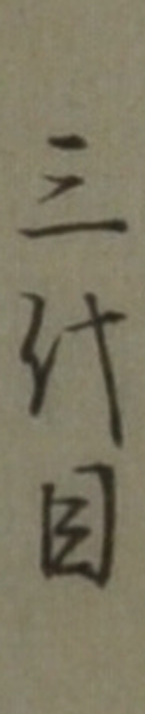三代目
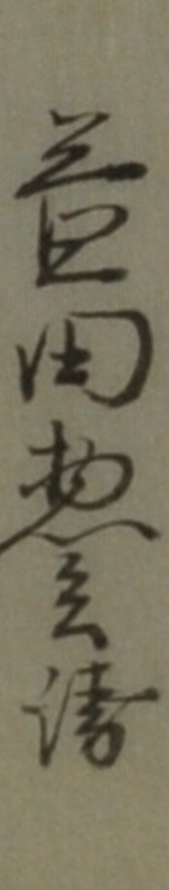益田惣兵衛
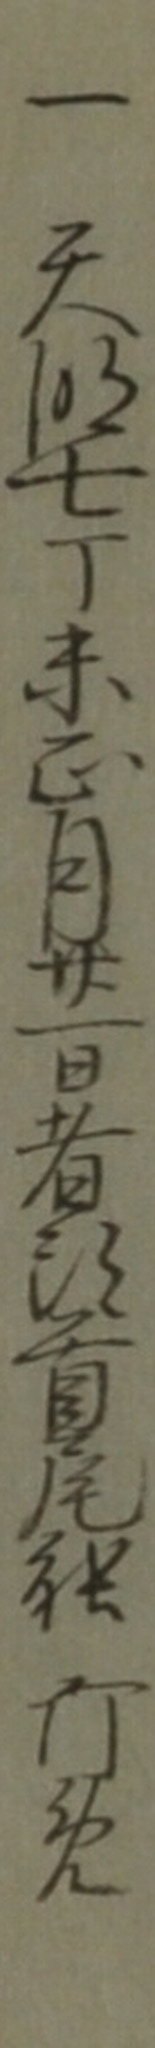一天明七丁未正月廿一日者頭首尾能御免
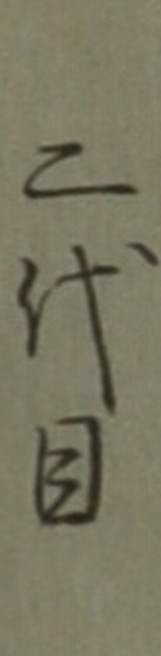二代目
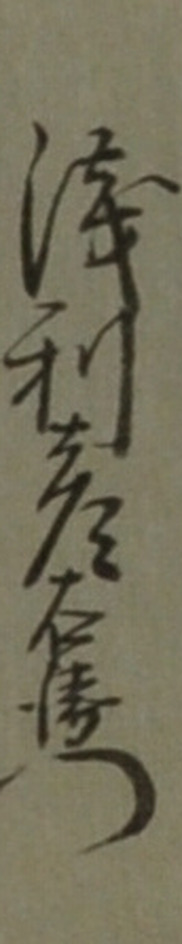浅利彦右衛門
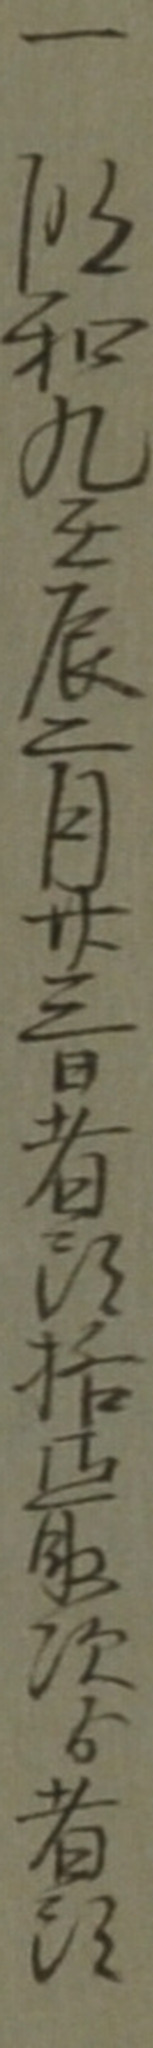一明和九壬辰二月廿三日者頭格御取次ゟ者頭
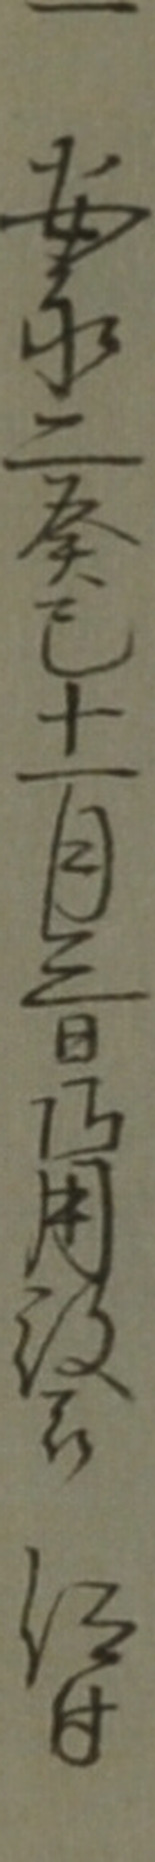一安永二癸巳十一月三日御用役被仰付
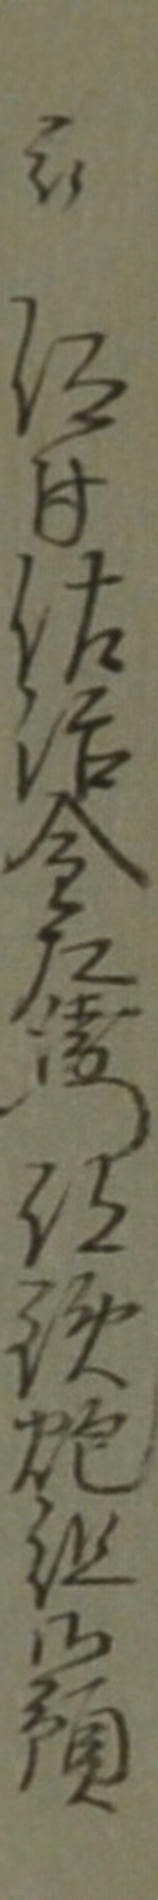被仰付佐治金左衛門鉄炮組御預
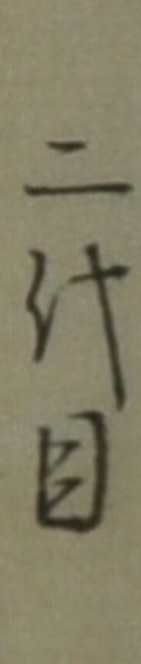二代目
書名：諸御役代々録（二）
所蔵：伊那市立高遠町図書館・合同会社AMANE
